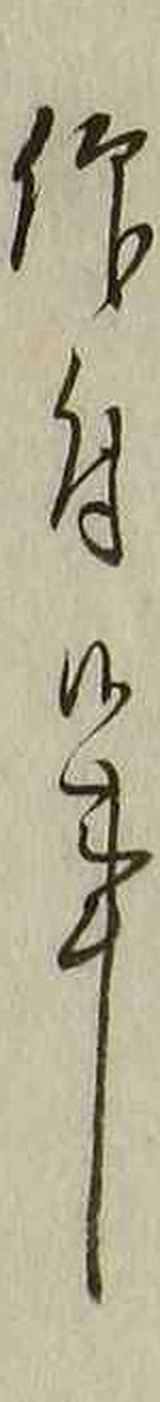仰付候事
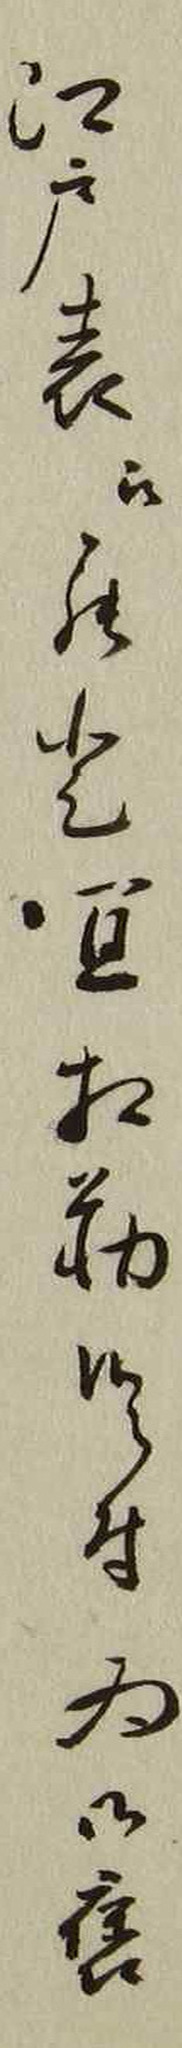江戸表江罷登宜相勤候に付為御褒
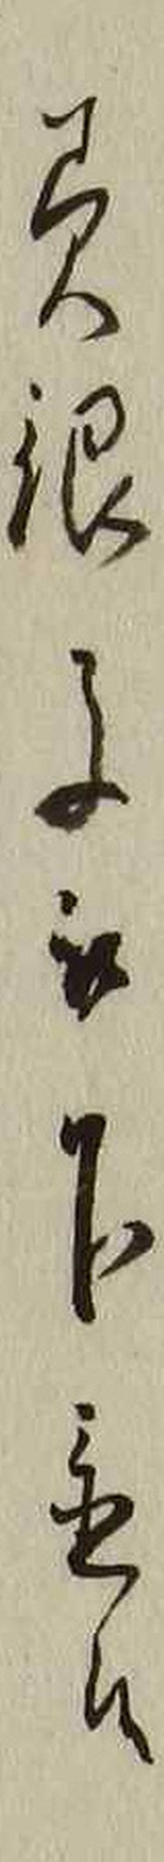美銀子被下置候
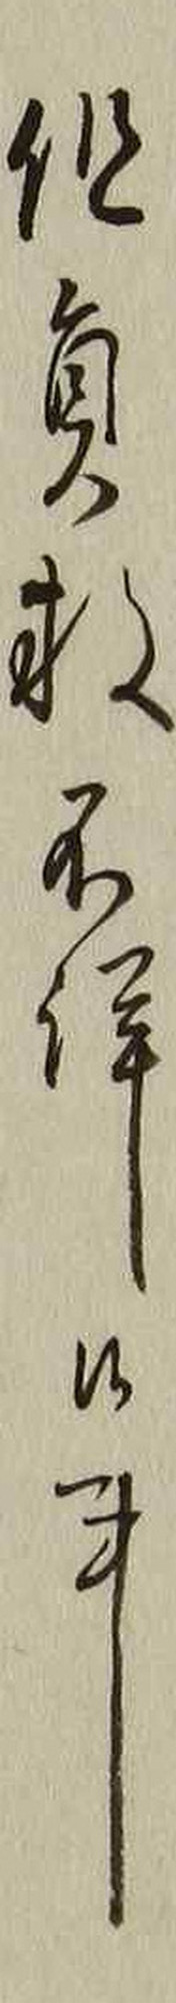但員数不詳候事
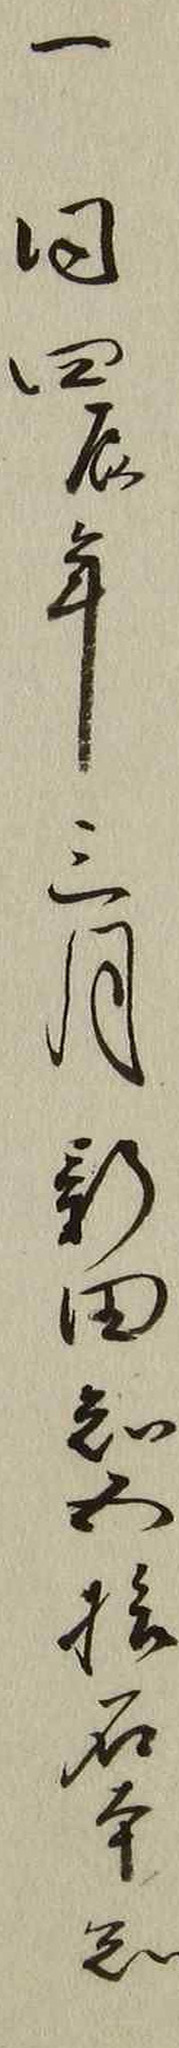一同四辰年三月新田知五拾石本知
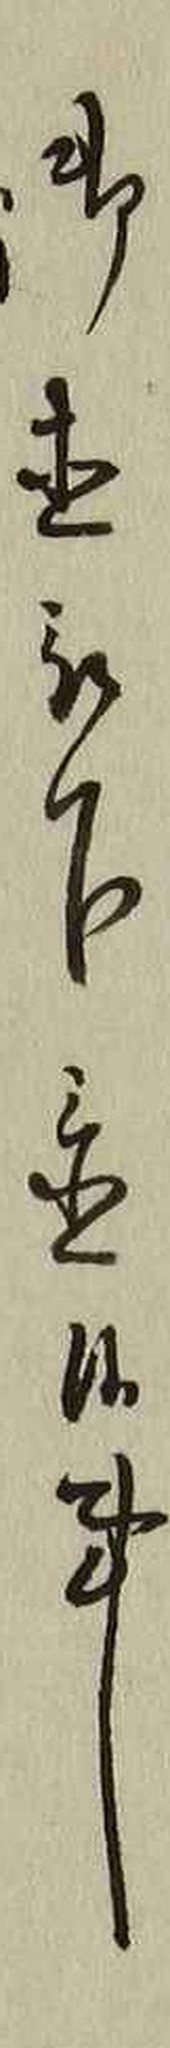御直被下置候事
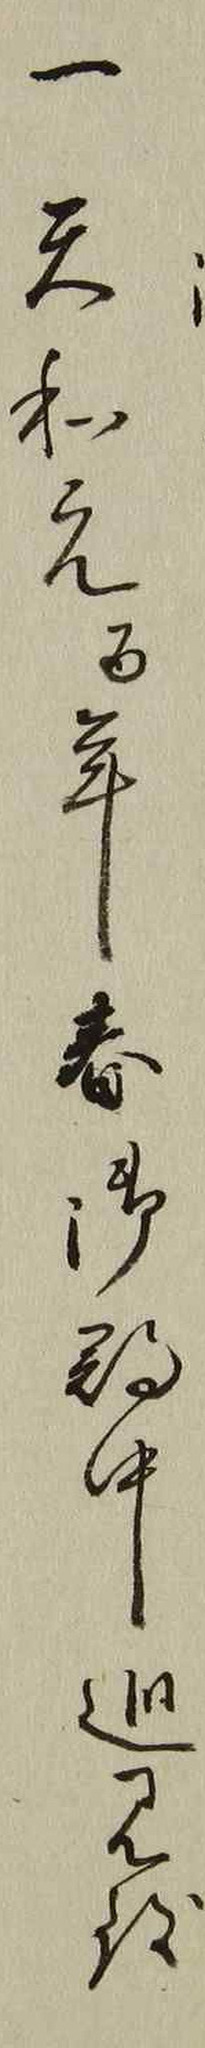一天和元酉年春御郡中巡見致
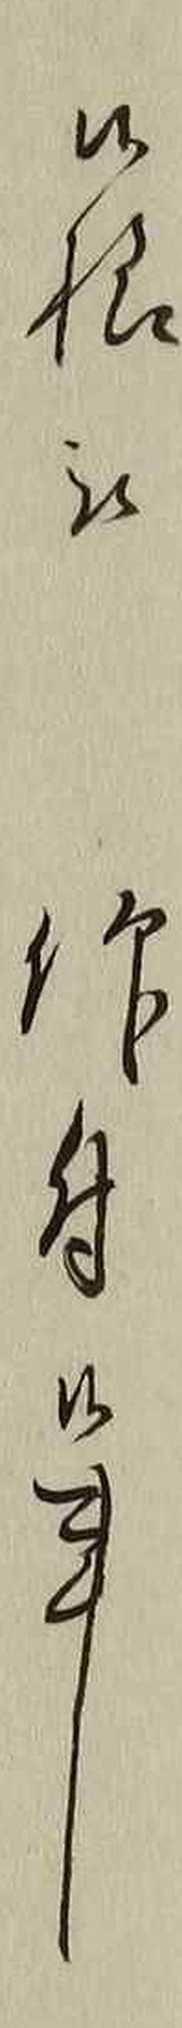候様被仰付候事
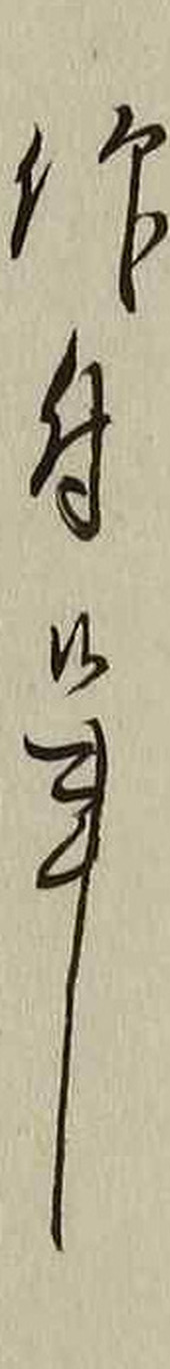仰付候事
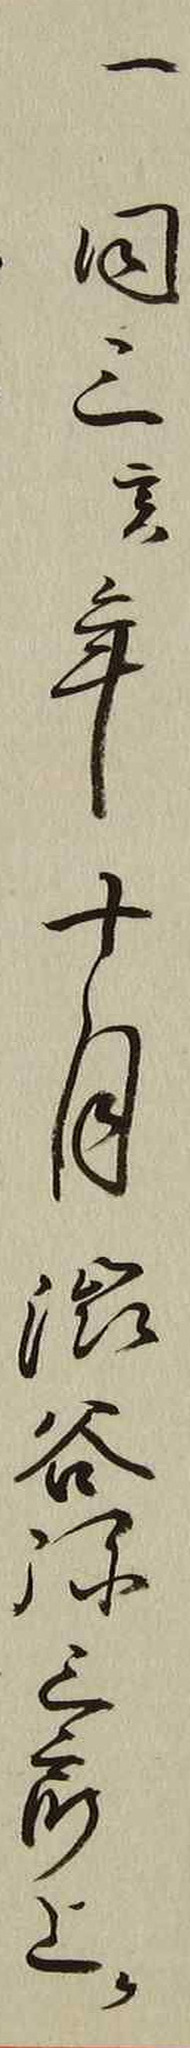一同三亥年十月渋谷弥三郎上り
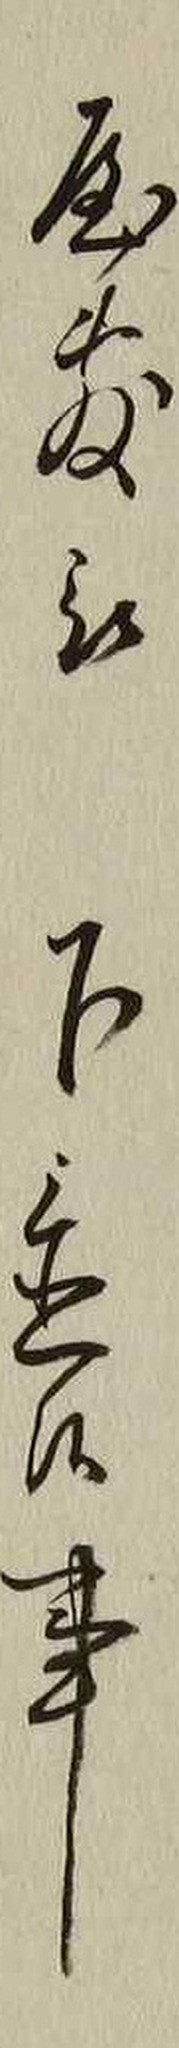屋敷被下置候事
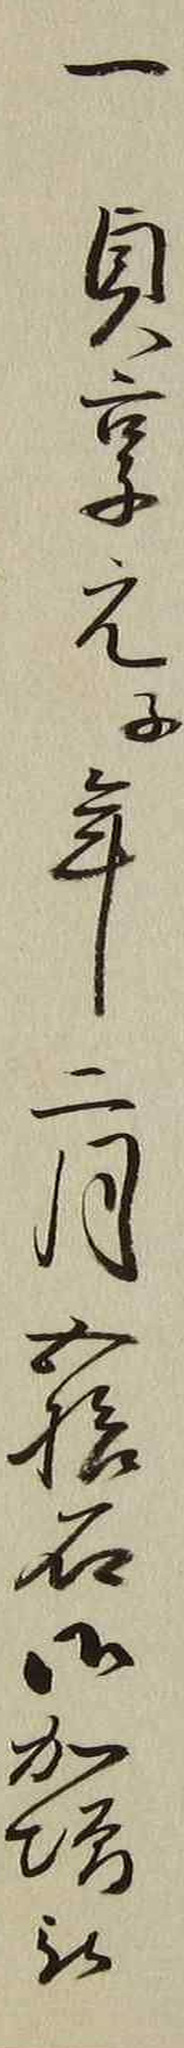一貞享元子年二月五拾石御加増被
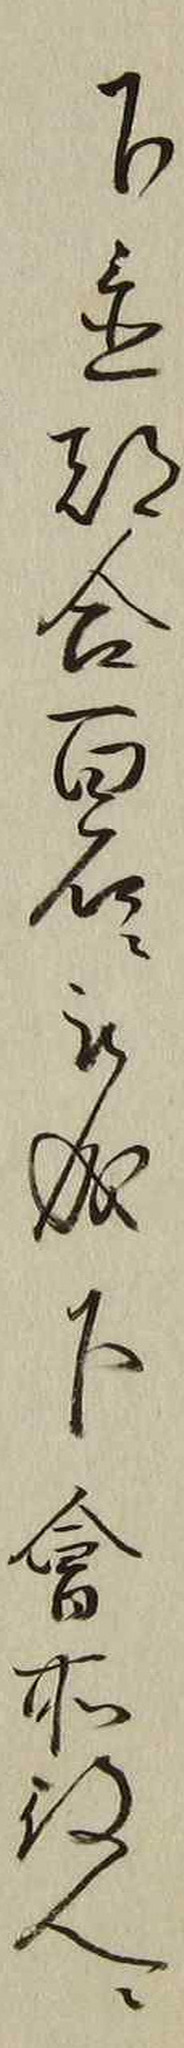下置都合百石に被成下會所役人に
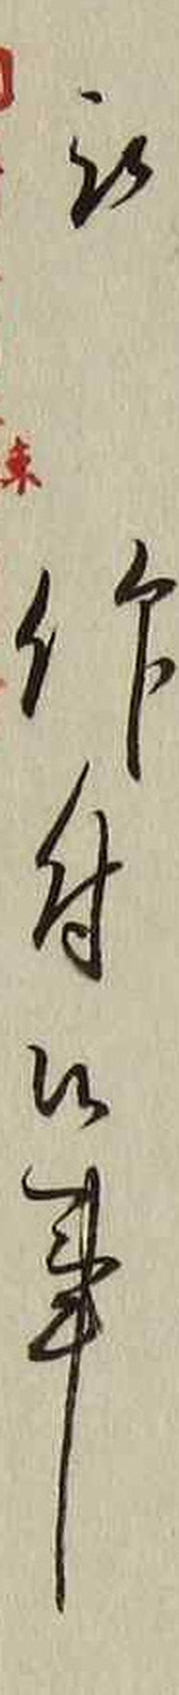被仰付候事
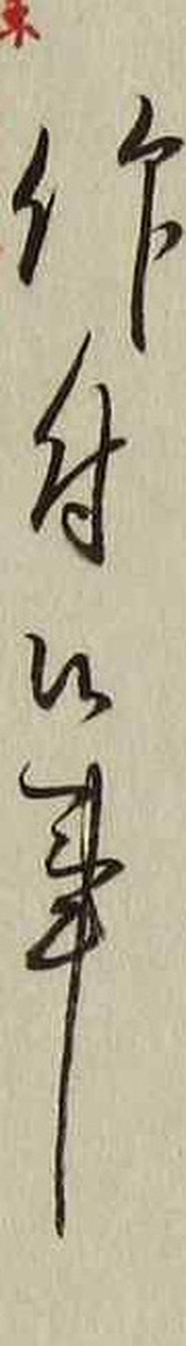仰付候事
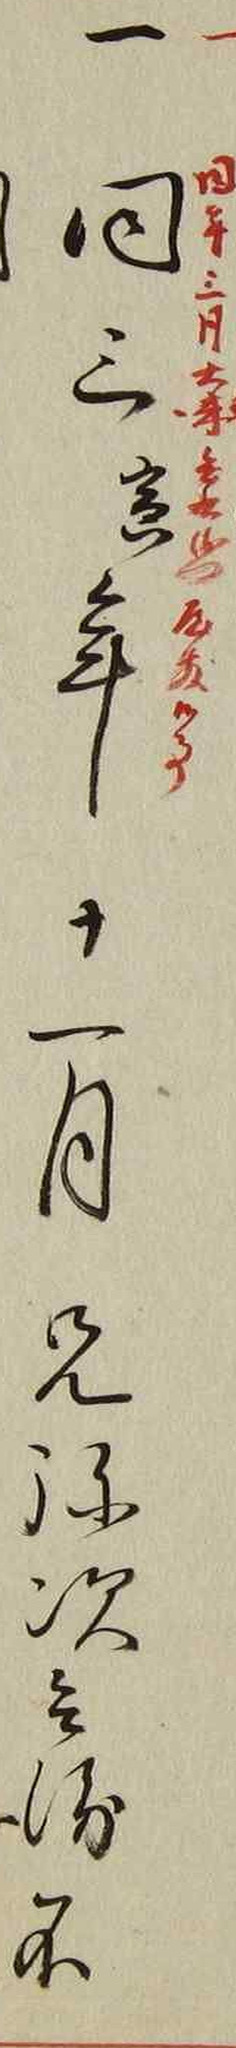一同三寅年十一月兄弥次兵衛不
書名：諸士系譜　巻之6　い之部6
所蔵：会津若松市立会津図書館
